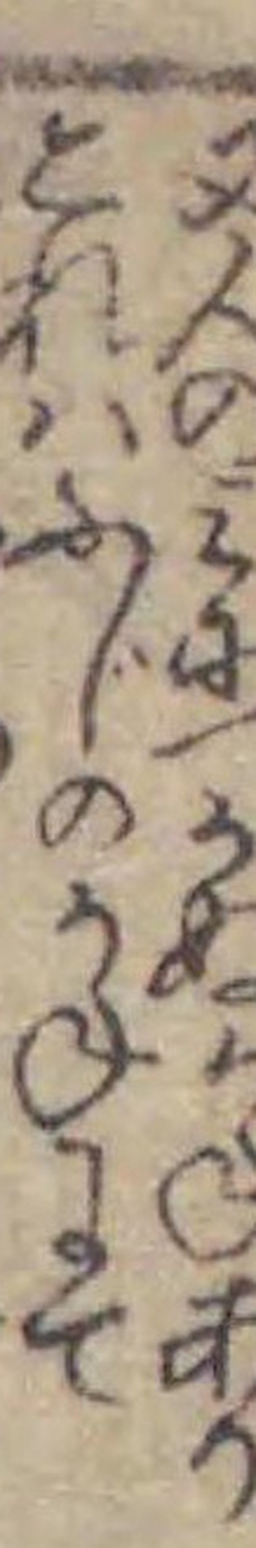これはふじのかねにて
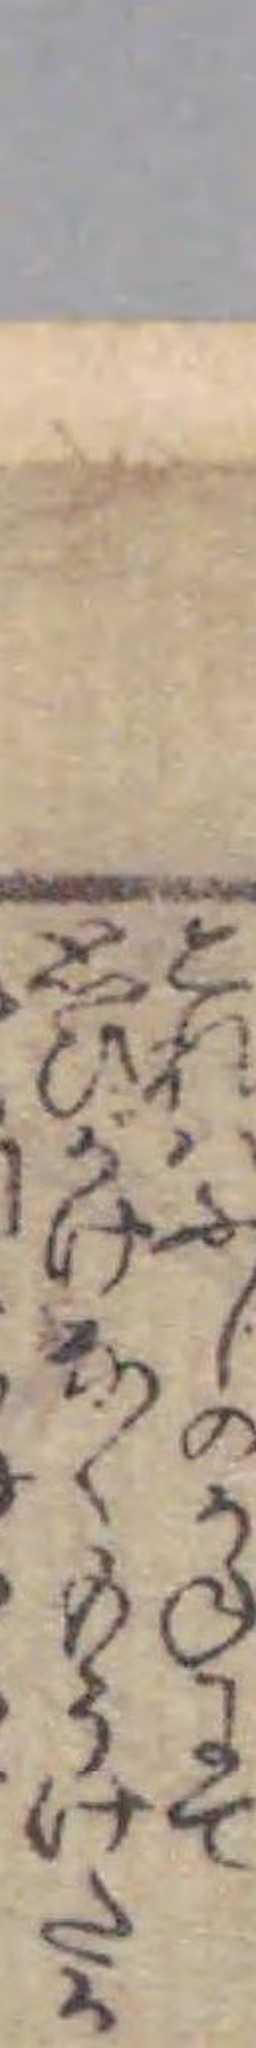思ひがけなくもうけたか
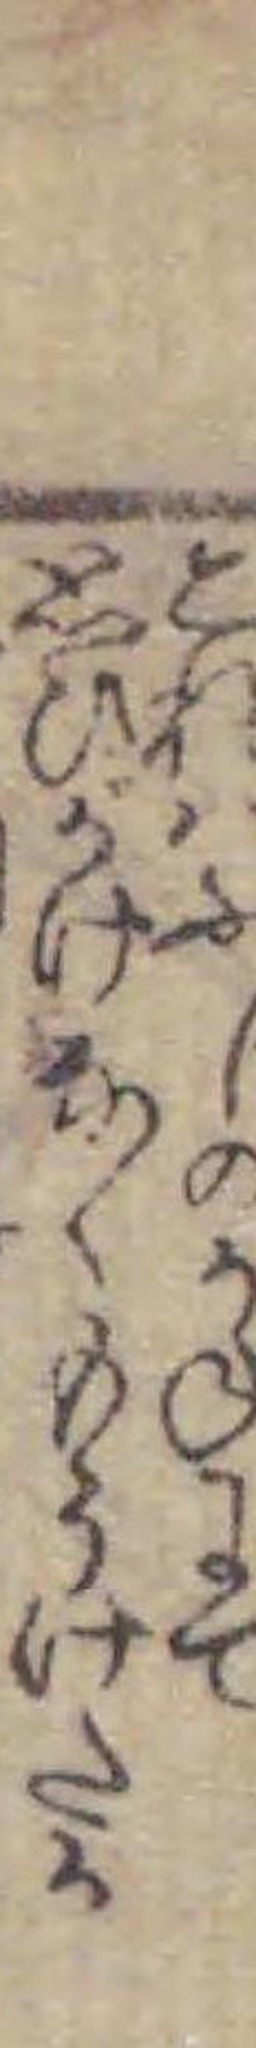思ひがけなくもうけたか
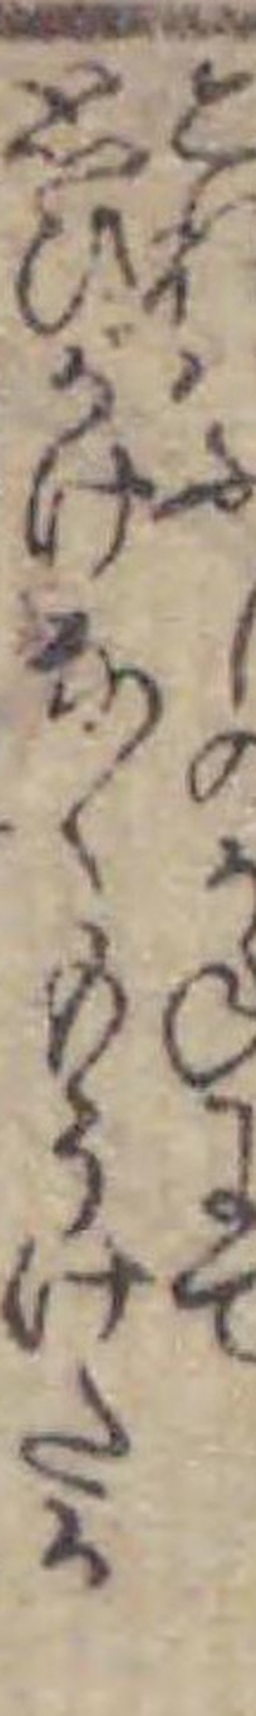思ひがけなくもうけたか
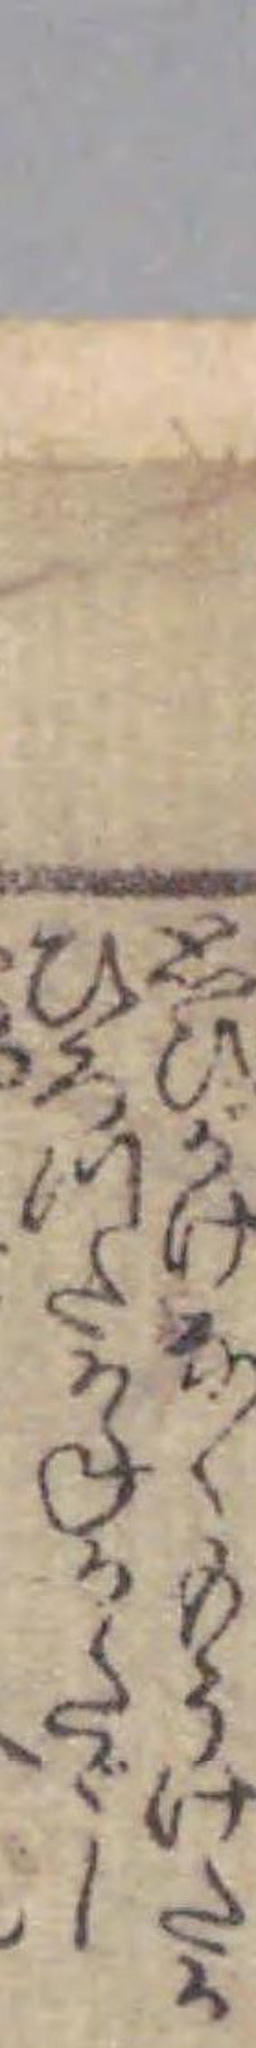ひろつたかねかたゞし
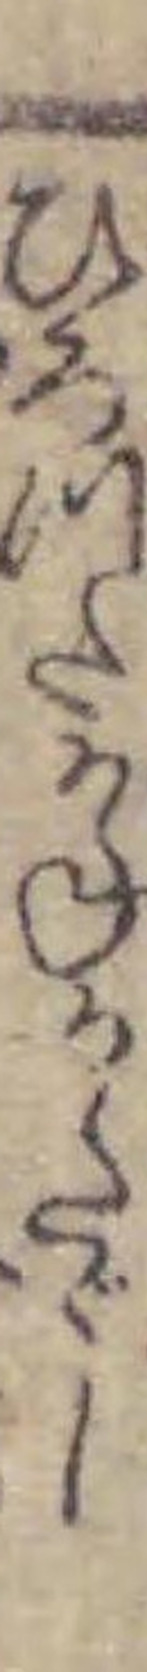ひろつたかねかたゞし
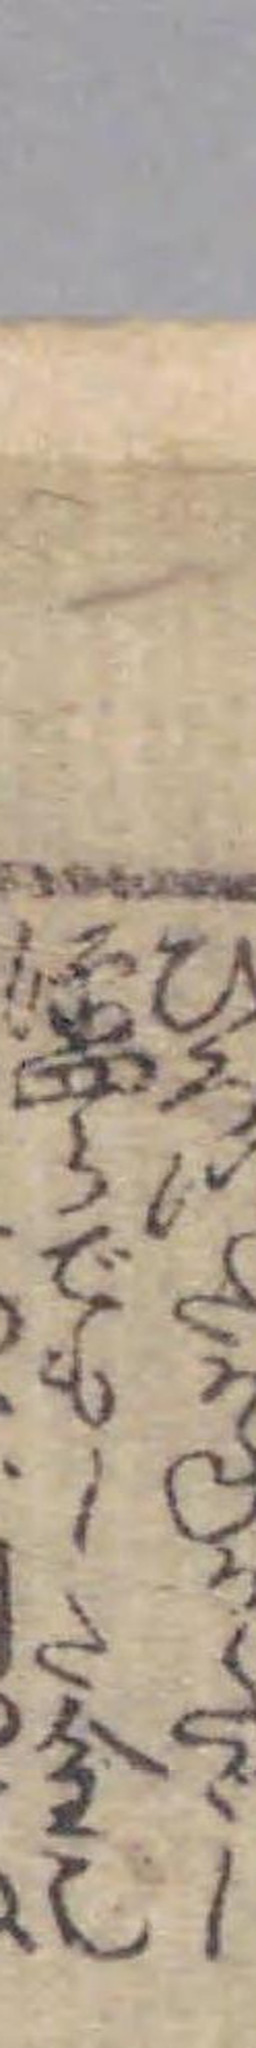源四郎でもした金也
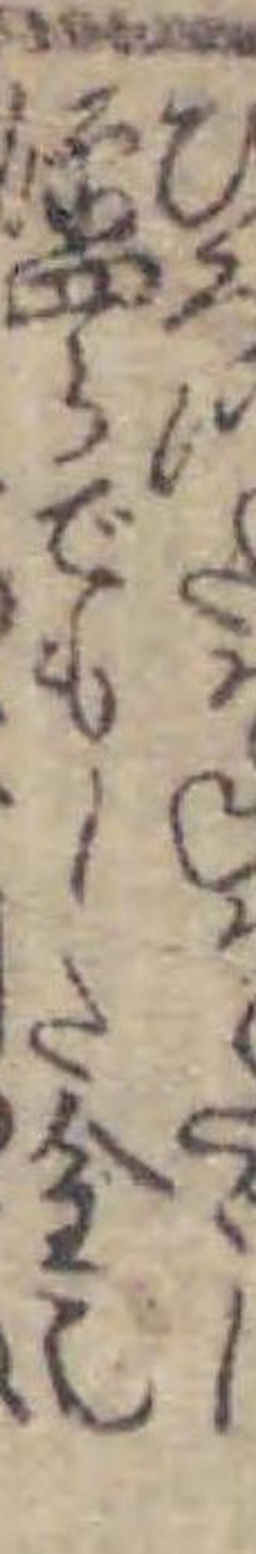源四郎でもした金也
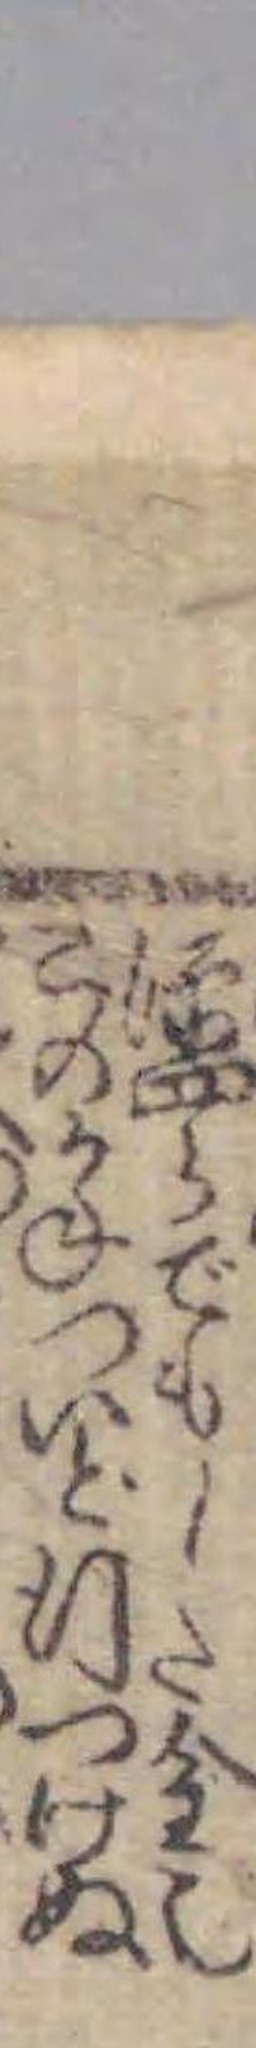このかねついど行つけぬ
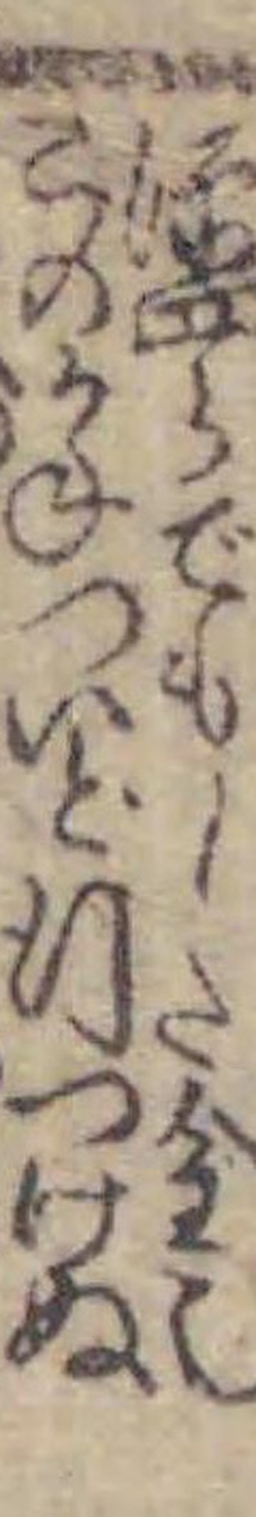このかねついど行つけぬ
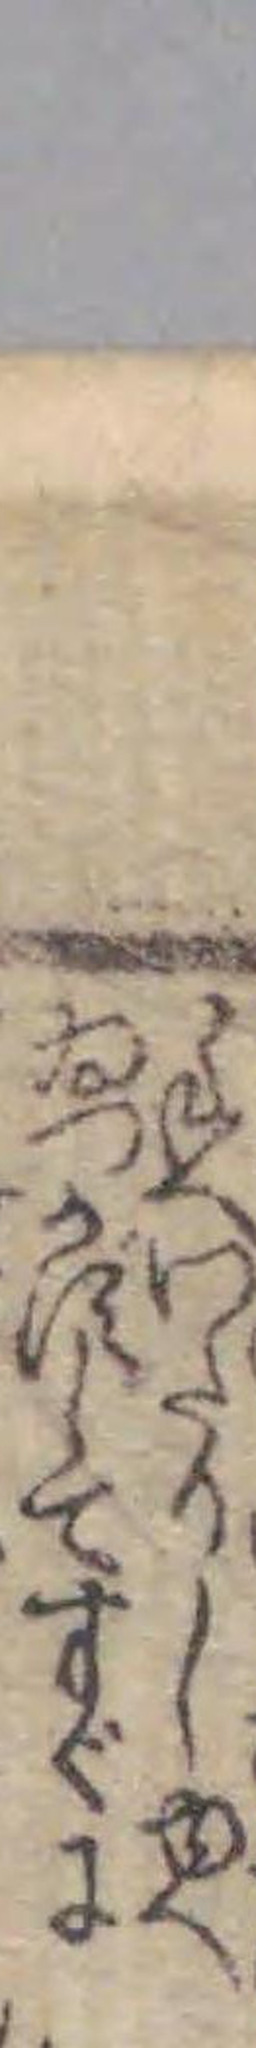ゐつかずしてすぐに
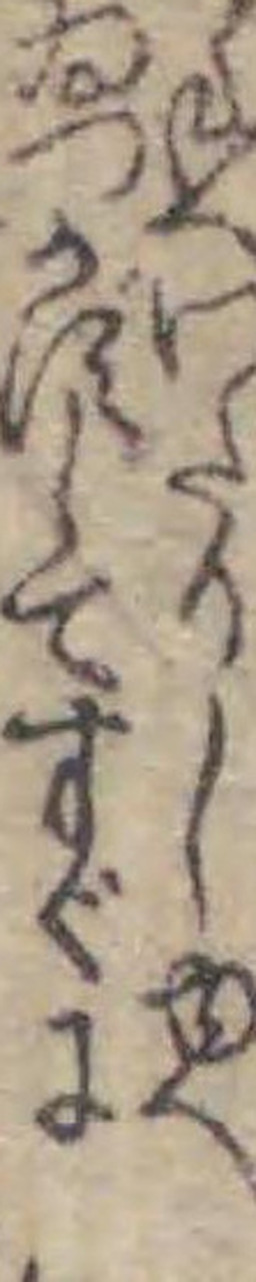ゐつかずしてすぐに
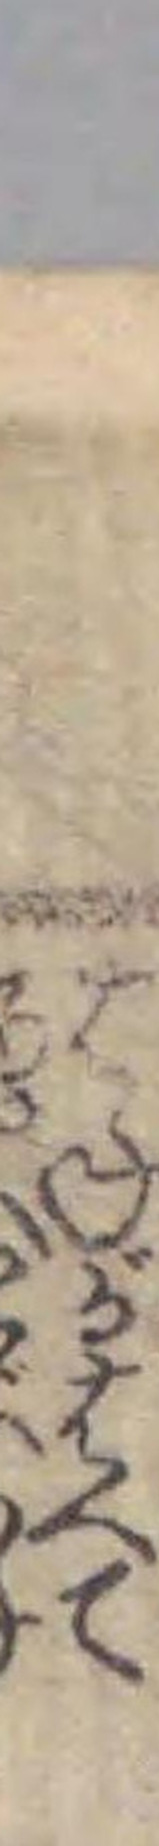はねがはへて
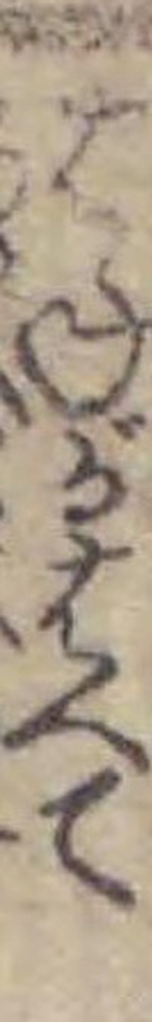はねがはへて
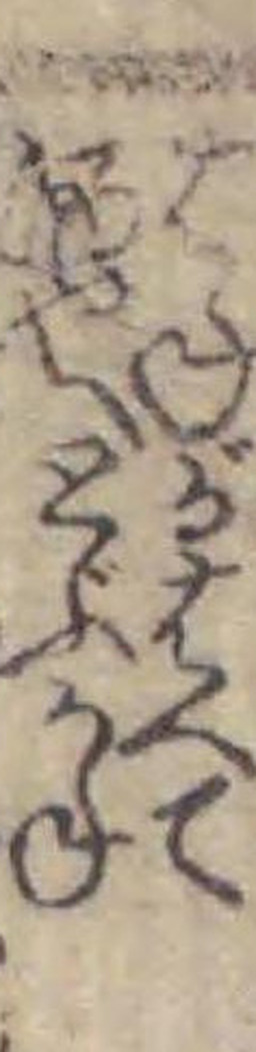酒やへとぶかね
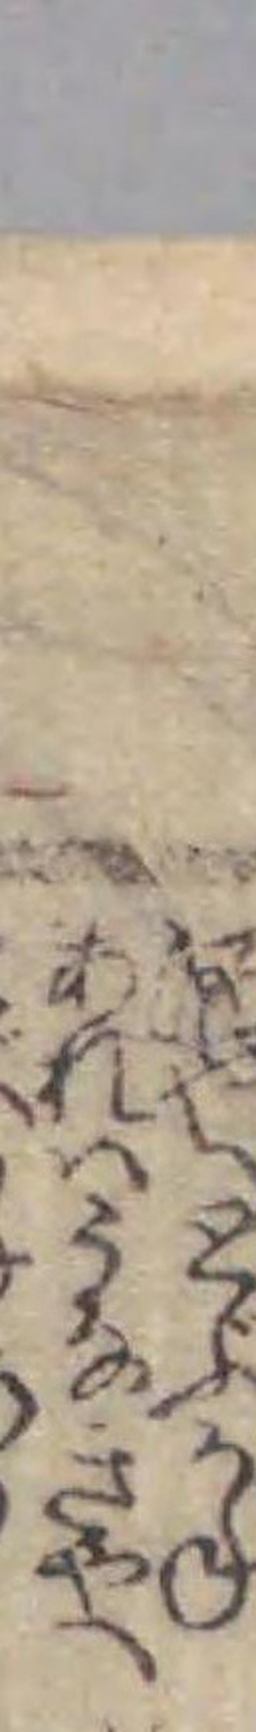あれはうなきやへ
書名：新鋳小判 : 3巻
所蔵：国立国会図書館 National Diet Library, JAPAN
